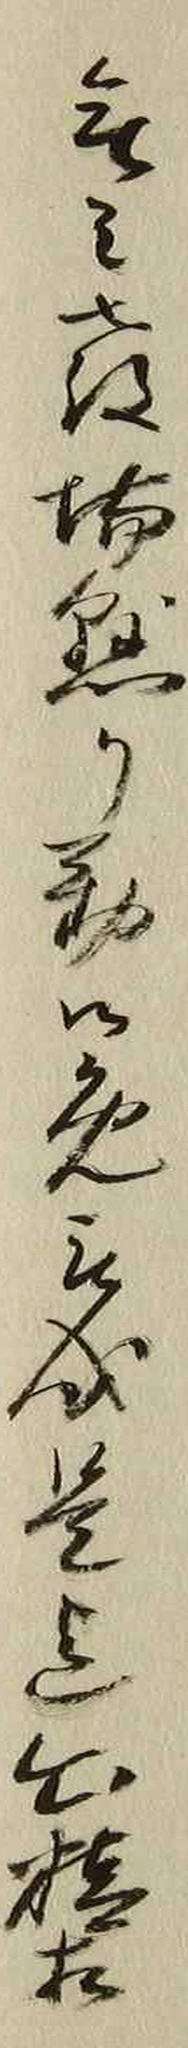無之教場懸り勤御免被成是迄出精相
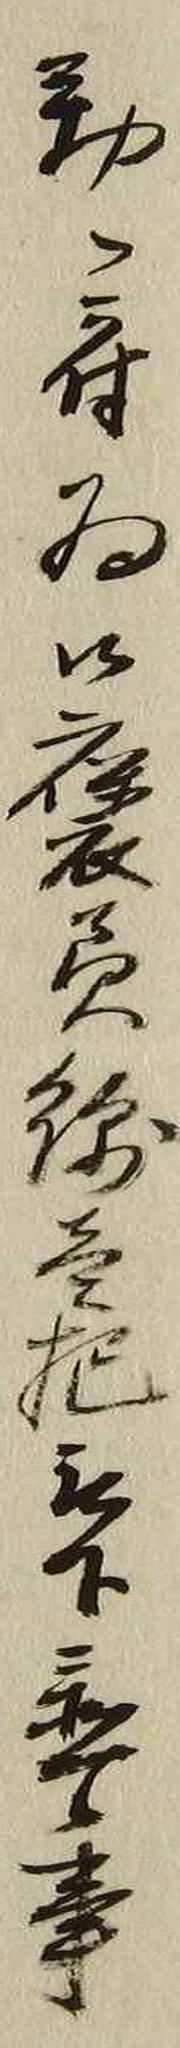勤候ニ付為御褒美綿壱把被下置候事
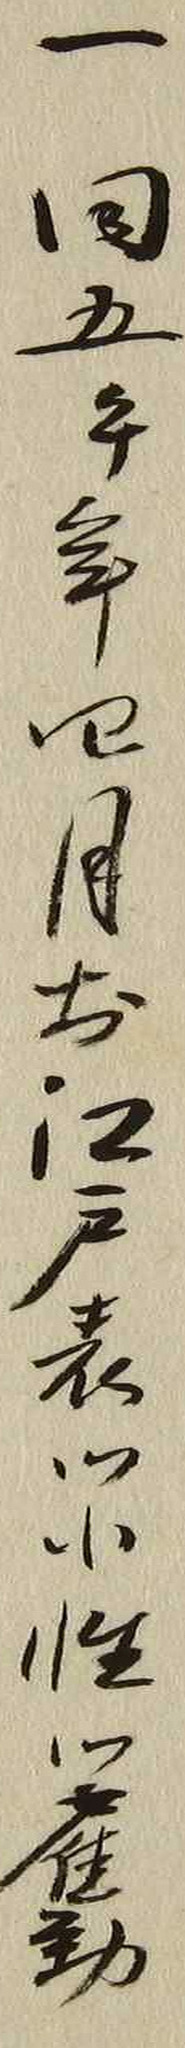一同五午年四月於江戸表御小性御雇勤
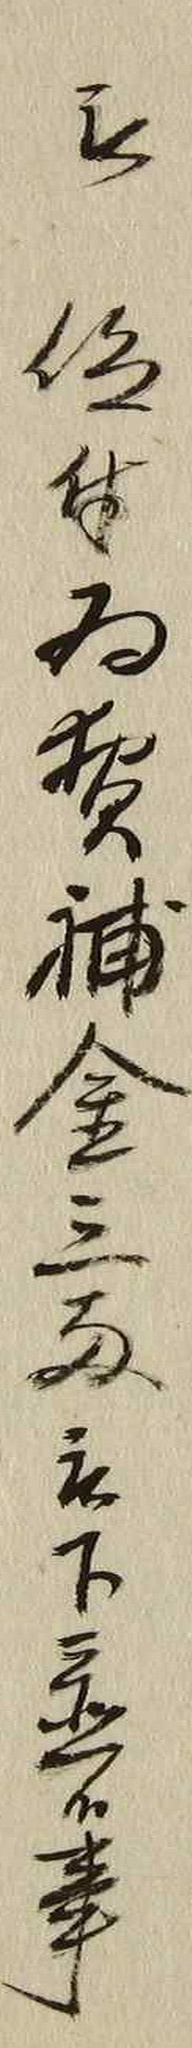被仰付為費補金三両被下置候事
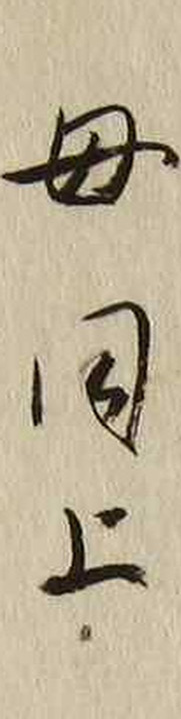母同上
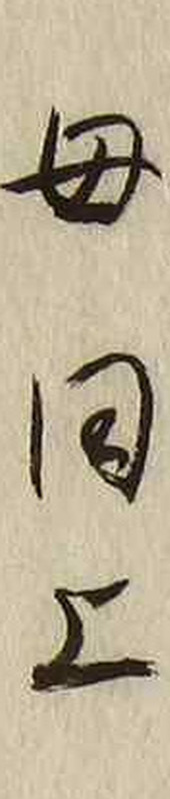母同上

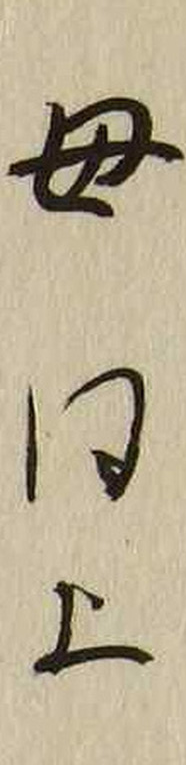母同上
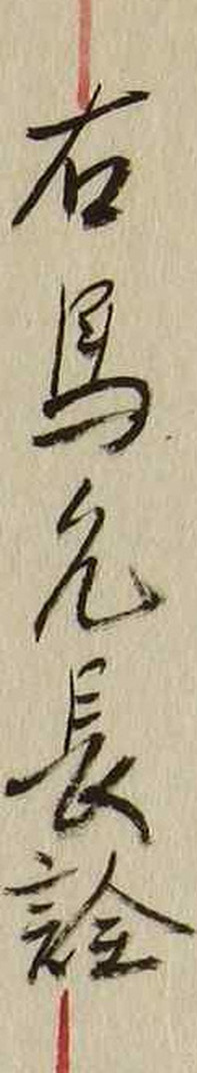右馬允長詮
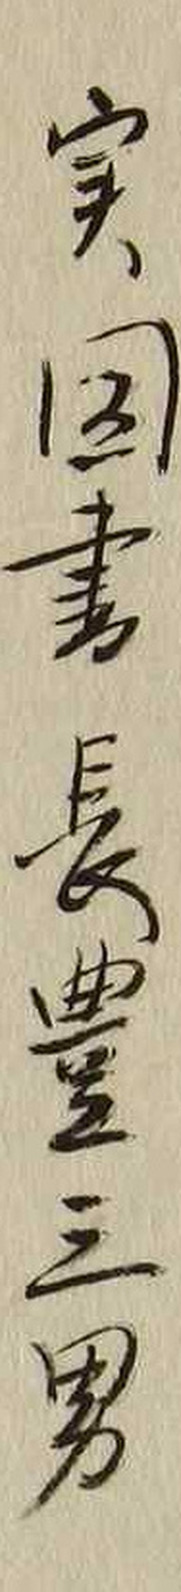実図書長豊三男
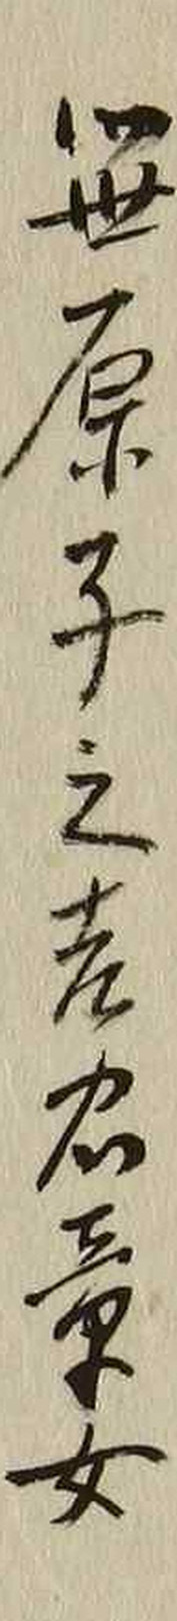笹原子之吉忠章女
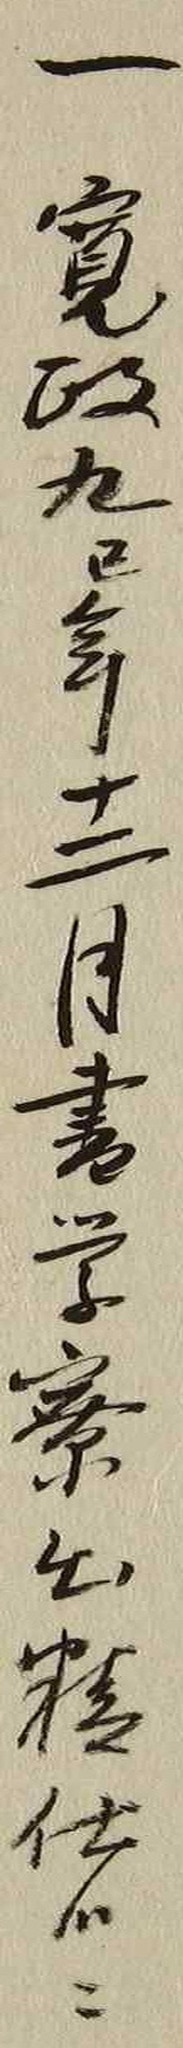一寛政九巳年十二月書学寮出精仕候ニ
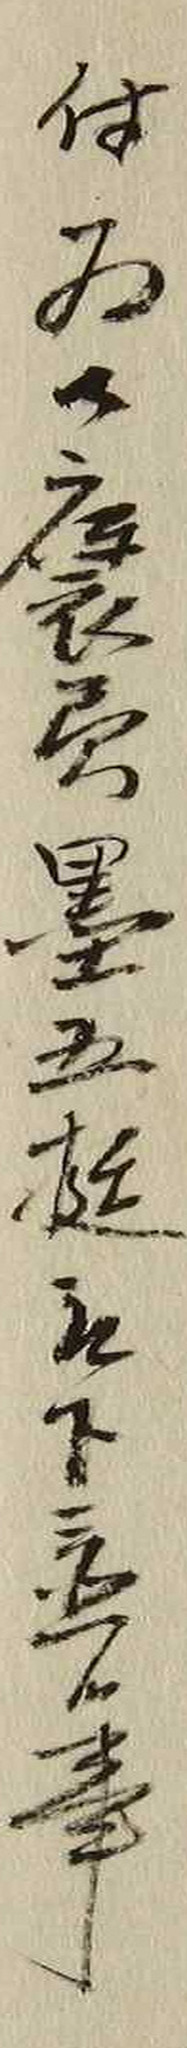付為御褒美墨五挺被下置候事
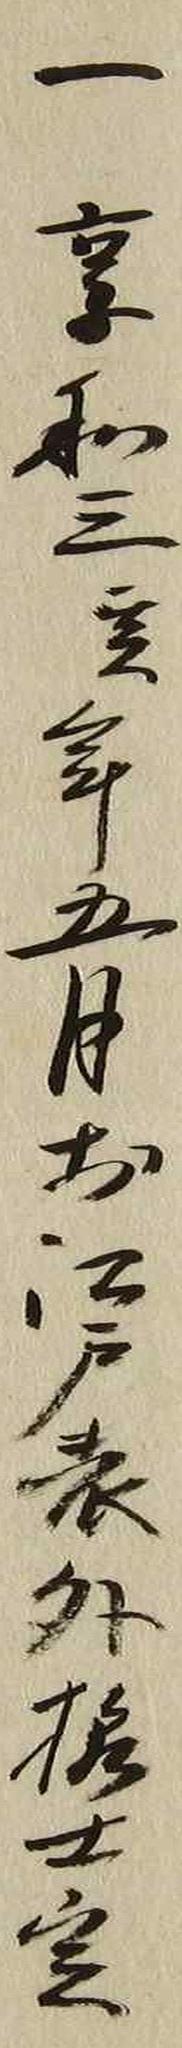一享和三亥年五月於江戸表外様士定
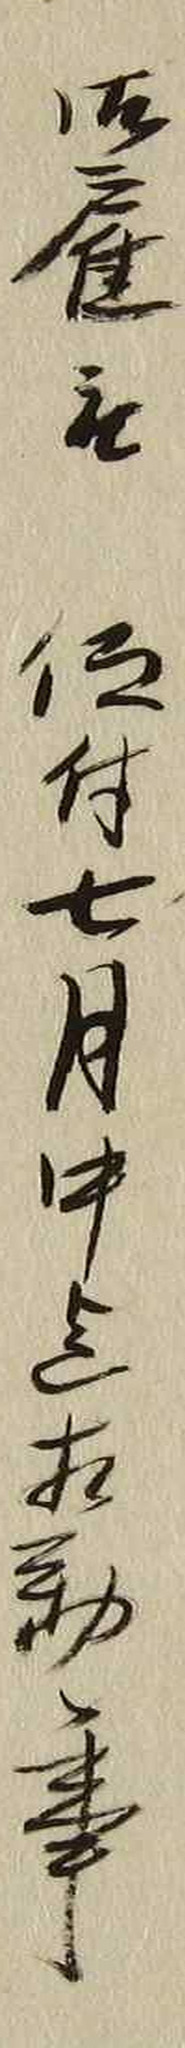御雇被仰付七月中迄相勤候事
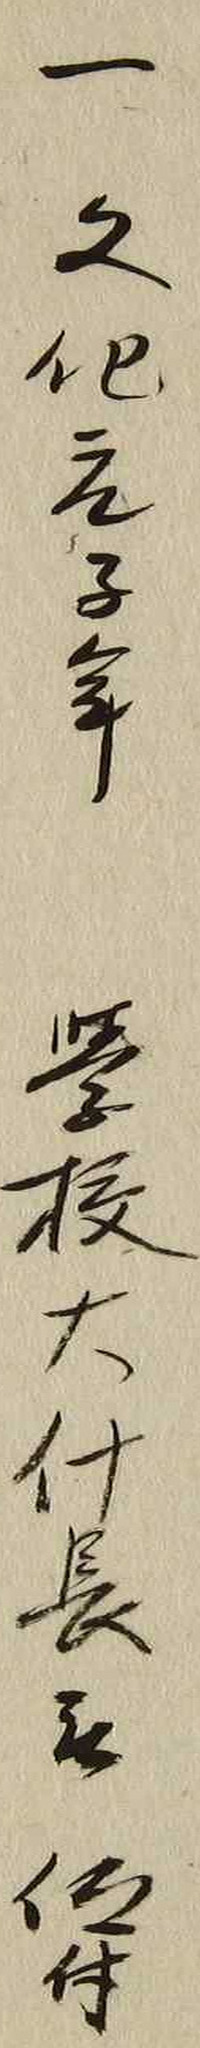一文化元子年学校大什長被仰付
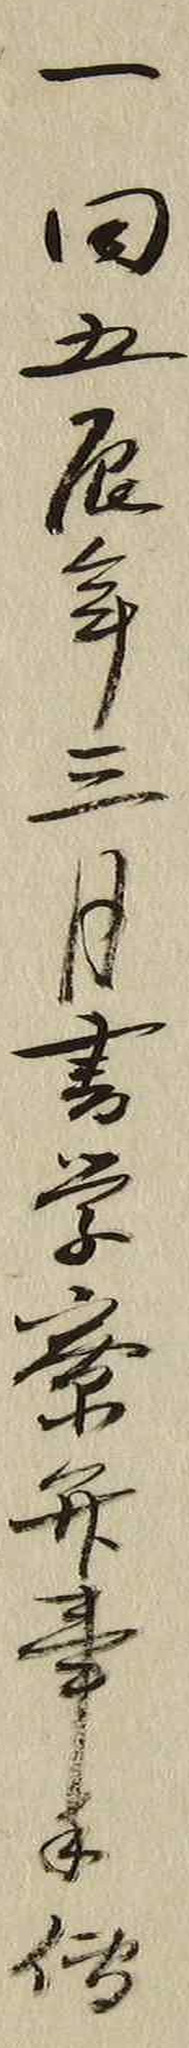一同五辰年三月書学寮弁事手伝
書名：諸士系譜　巻之345　も之部1
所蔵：会津若松市立会津図書館
